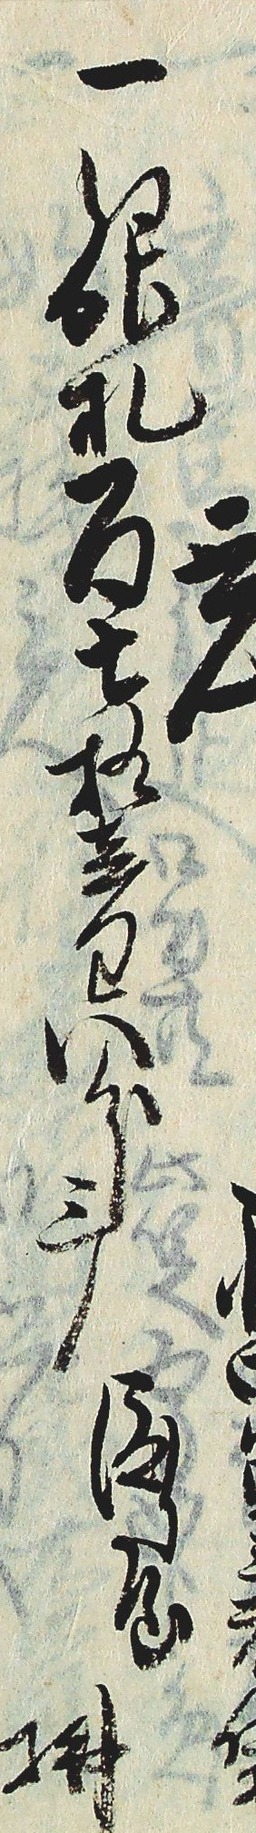一銀札百七拾壱匁八分三厘渡り屋
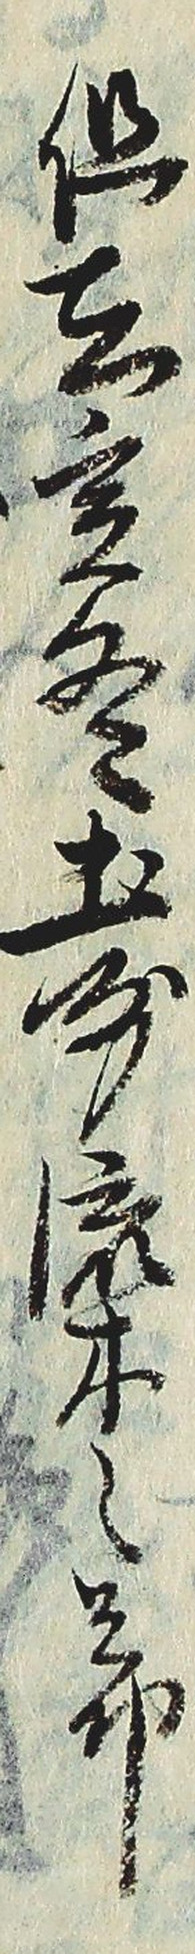但去亥冬土州流木之節払
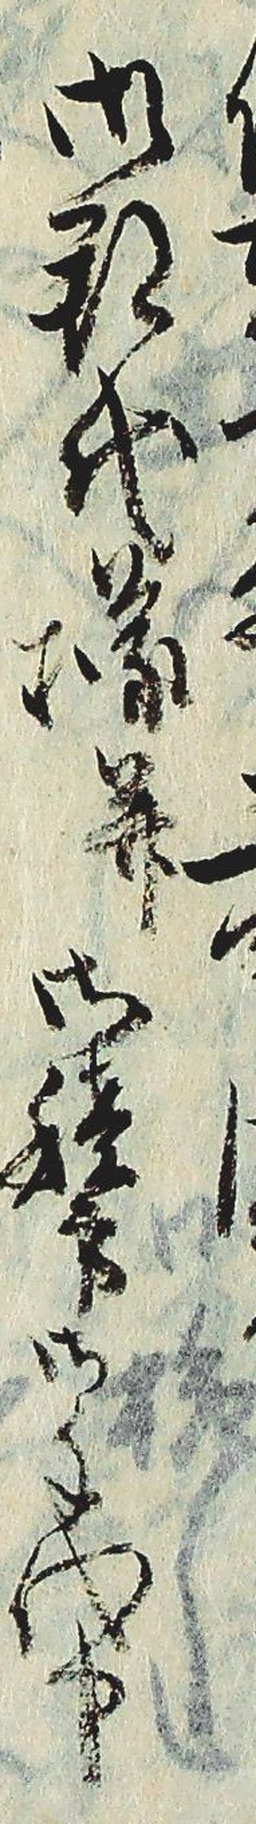御郡代様并御積方御手代中
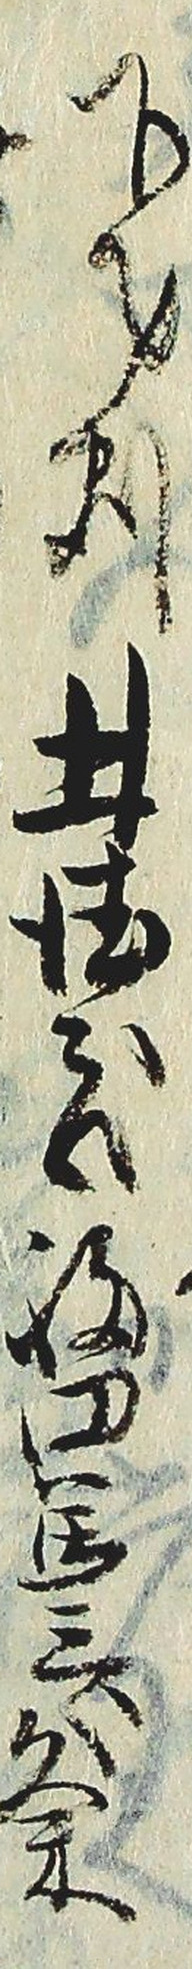下才判井徳蔵福田篤三郎久米
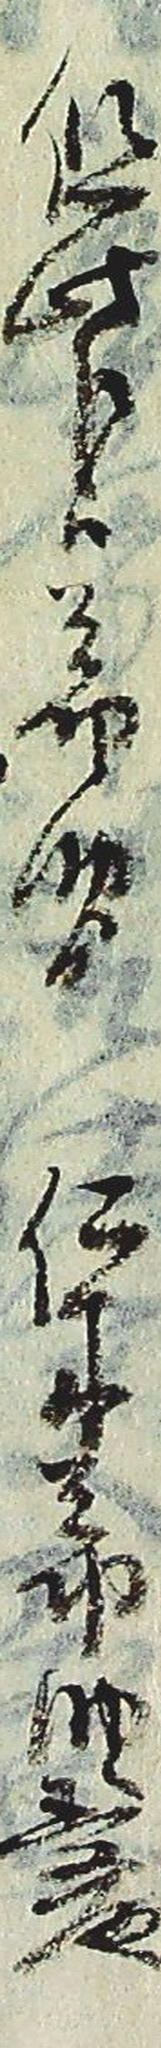但此分は節助ゟ仁木節助へ受渡
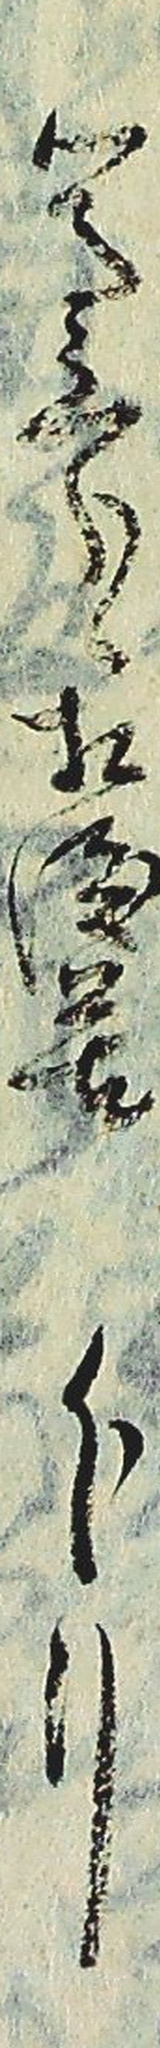篤三郎へ相渡筈分引
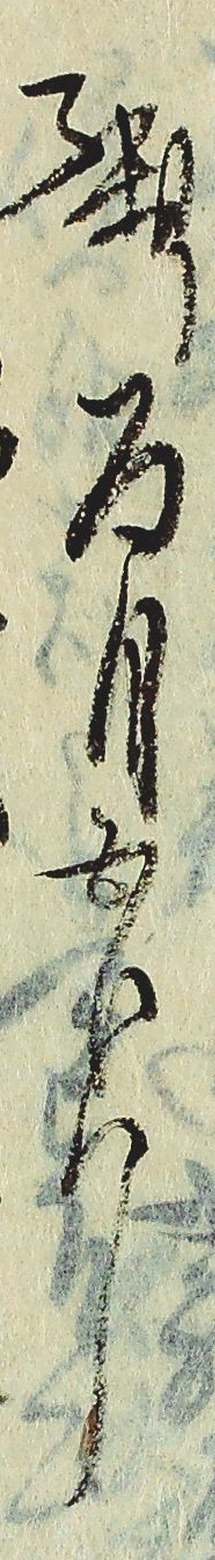残り百目五分八厘
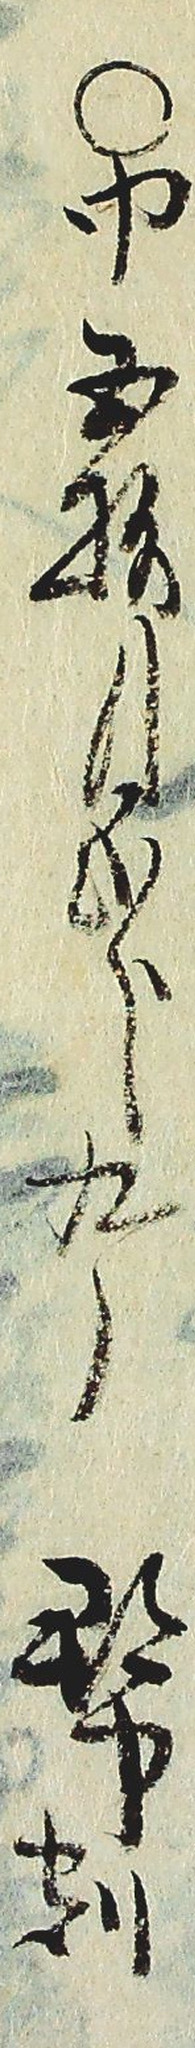内五拾目弐分九厘郡中割
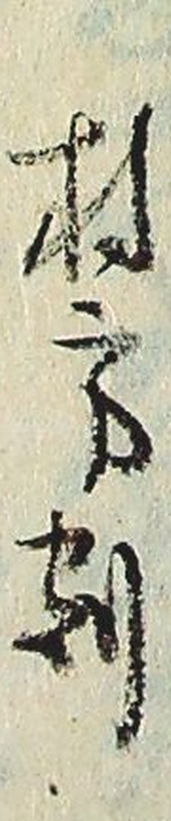村方割
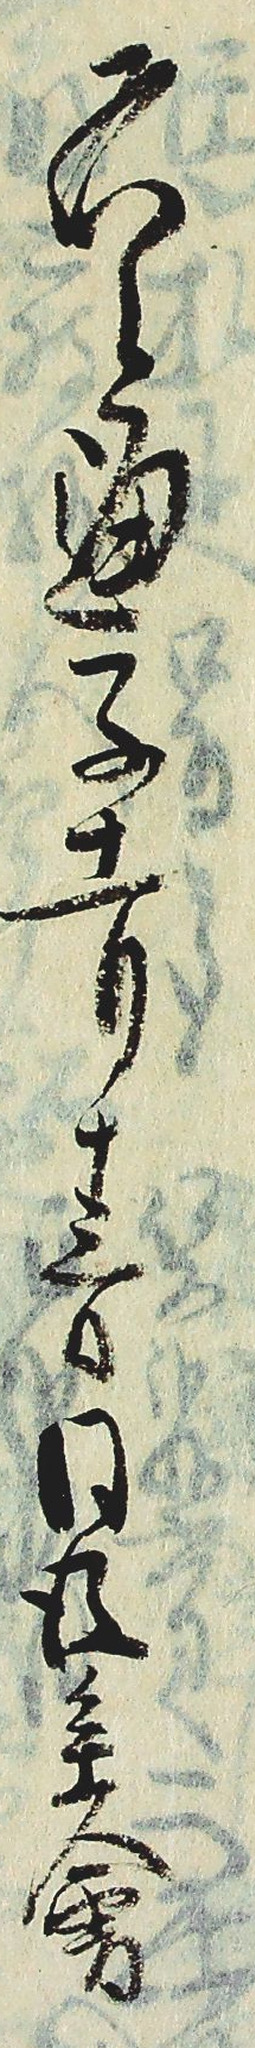右之通子十一月十三日同役参会
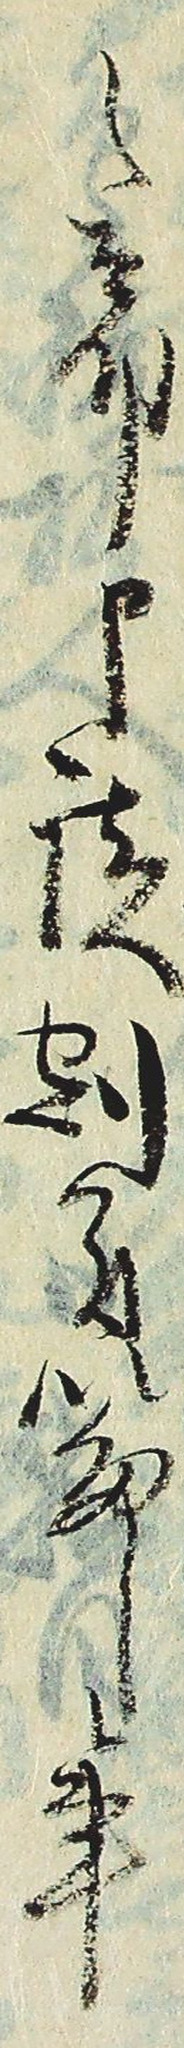之節申談割苻いたし候事
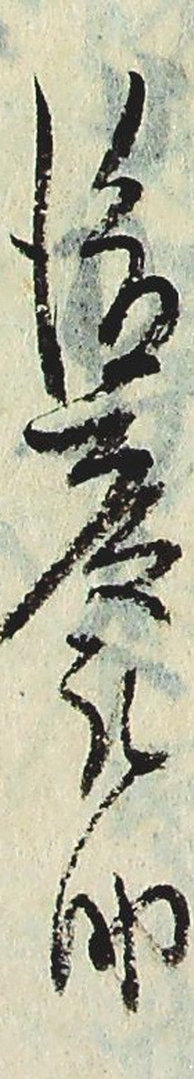後藤庄助

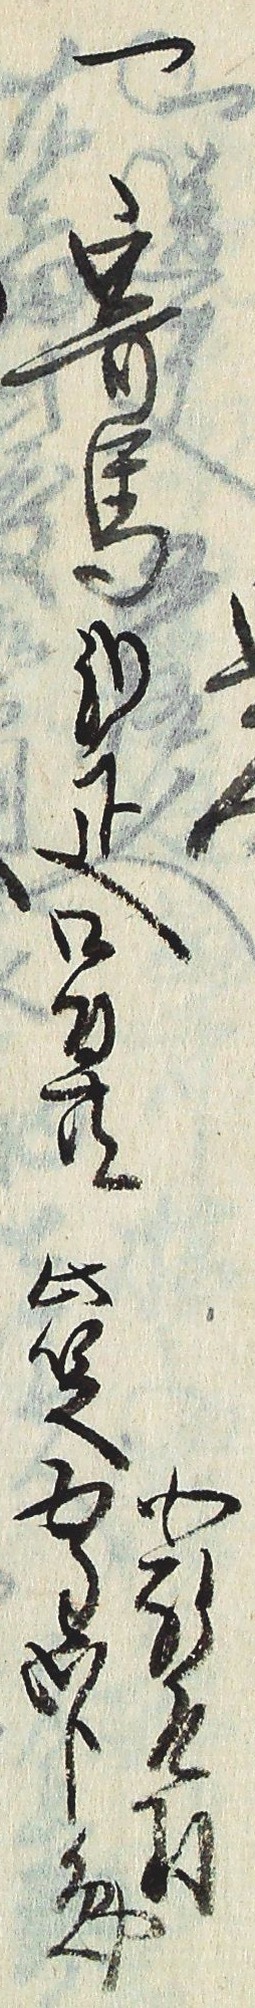一寄馬弐疋口付共此賃五匁弐分
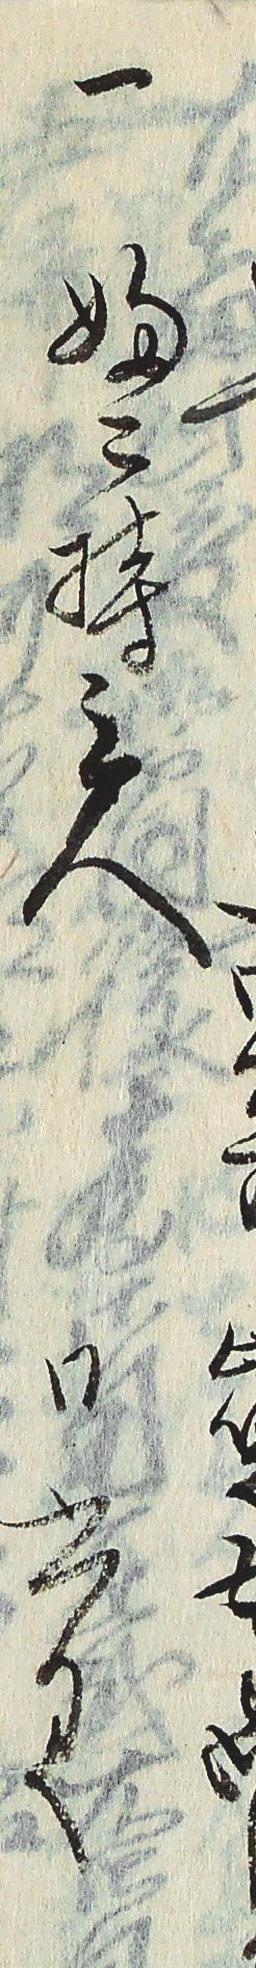一ふこ持三人同六匁
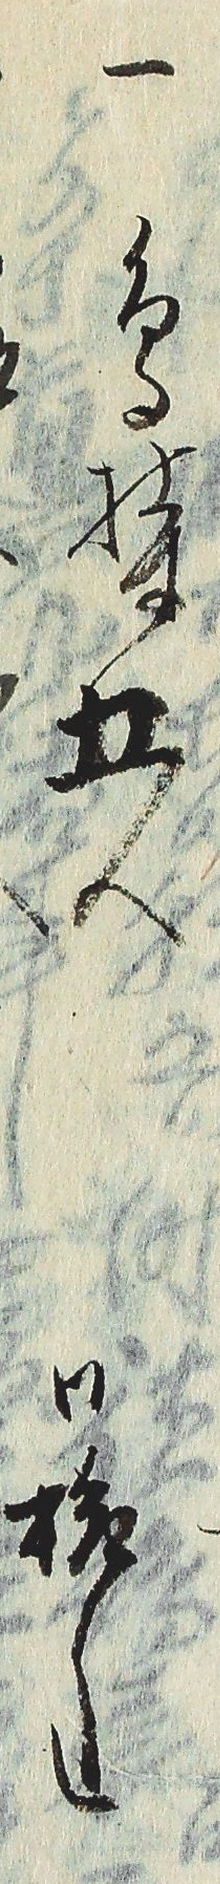一鳥持五人同拾匁
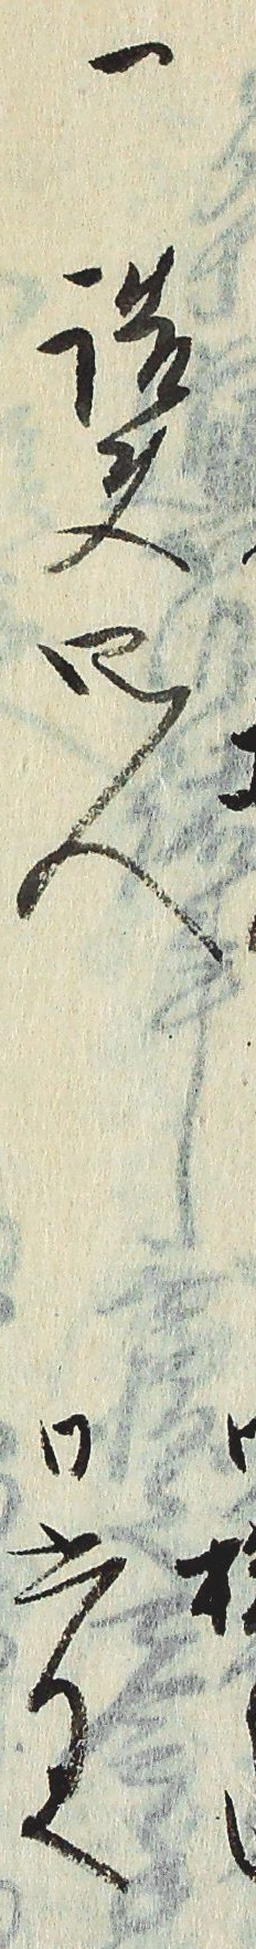一詰夫四人同六匁
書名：名東郡中諸割賦元帳
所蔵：鳴門教育大学 Naruto University of Education
